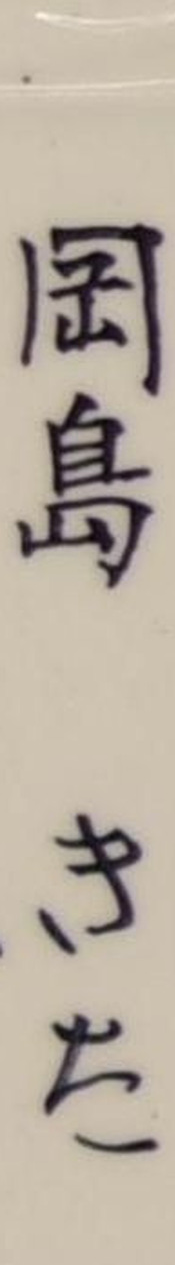岡島きた

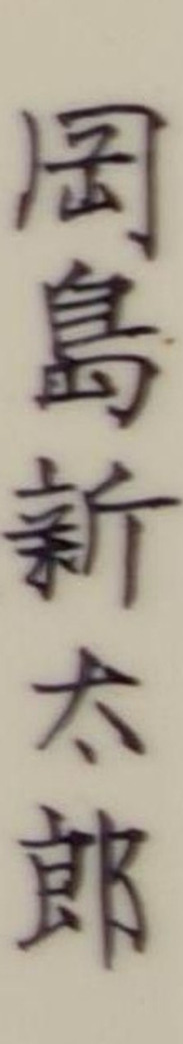岡島新太郎
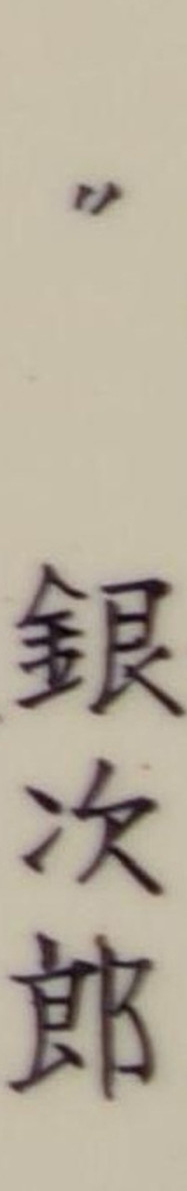金次郎
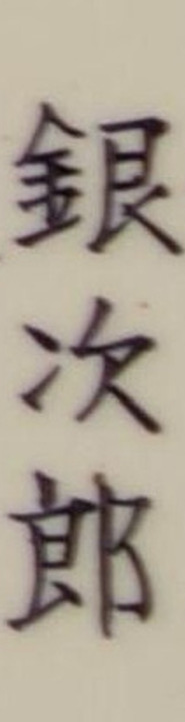金次郎
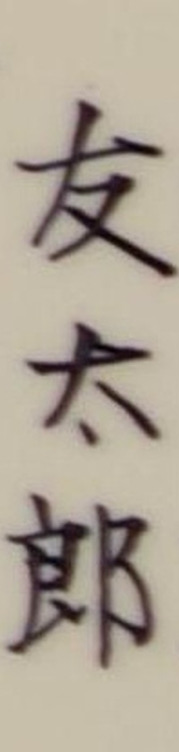友太郎
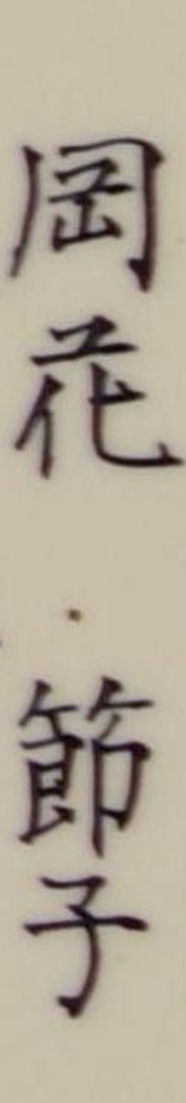岡花節子
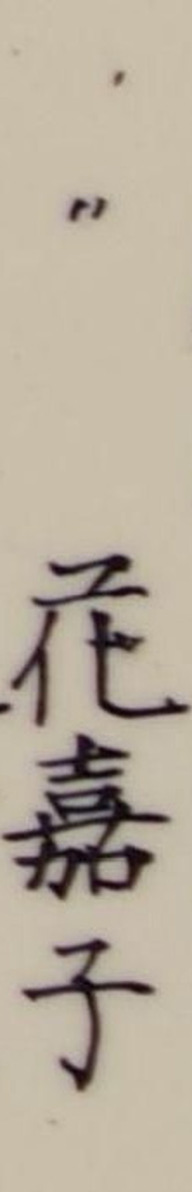花嘉子
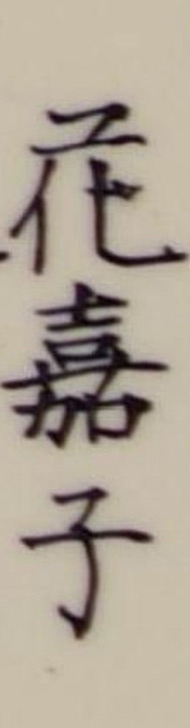花嘉子
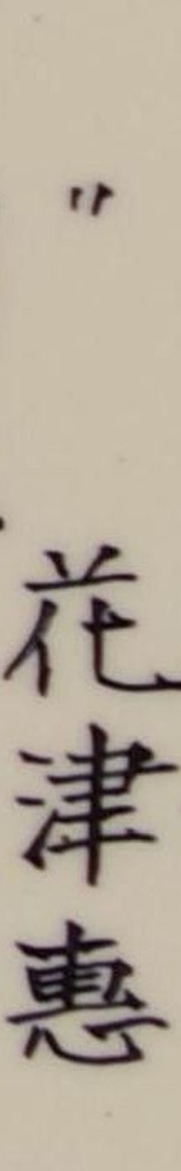花津惠
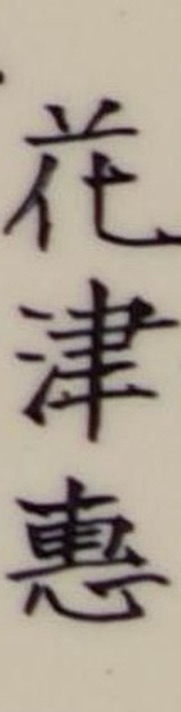花津惠
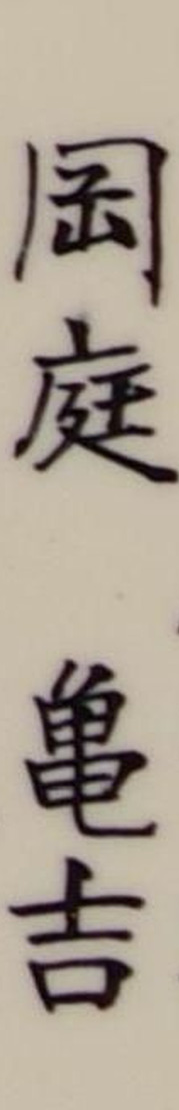岡庭亀吉
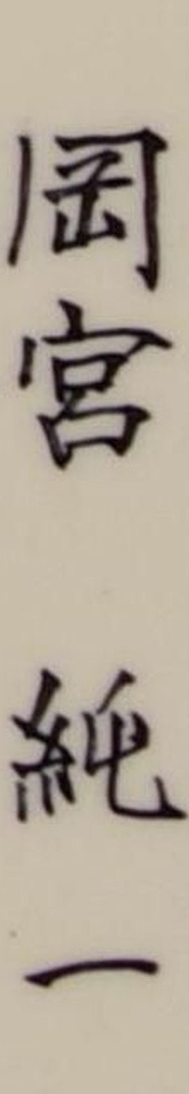岡宮純一
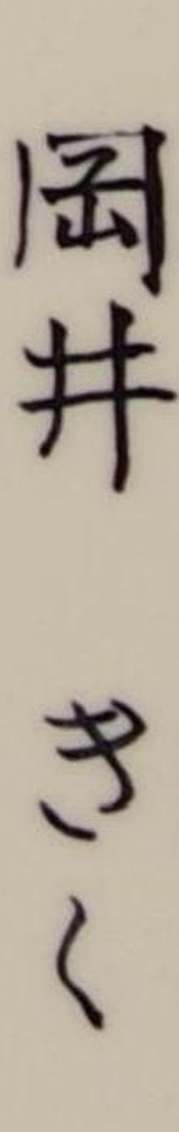岡井きく
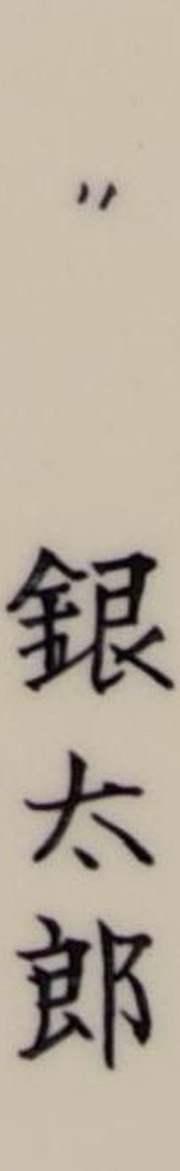銀太郎
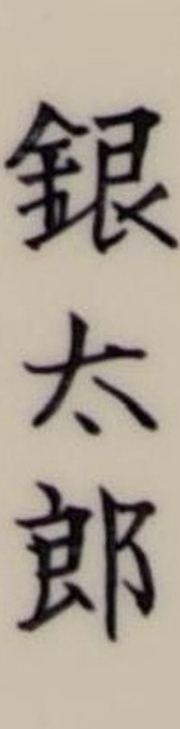銀太郎
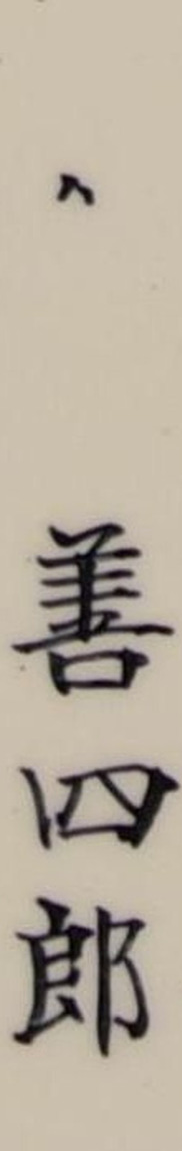善四郎
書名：E~L
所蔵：高野山金剛峯寺
